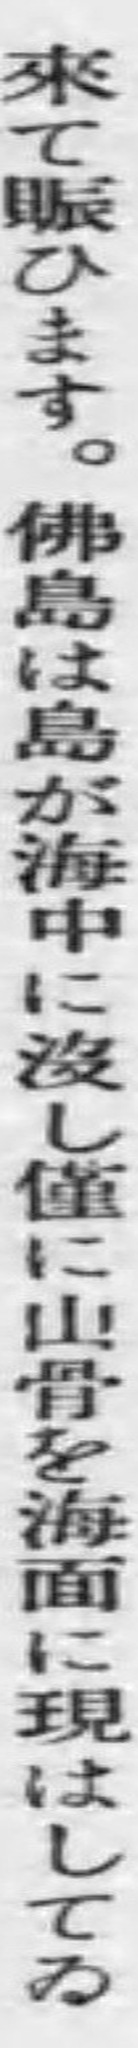来て賑ひます。仏島は島が海中に没し僅に山骨を海面に現はしてゐ
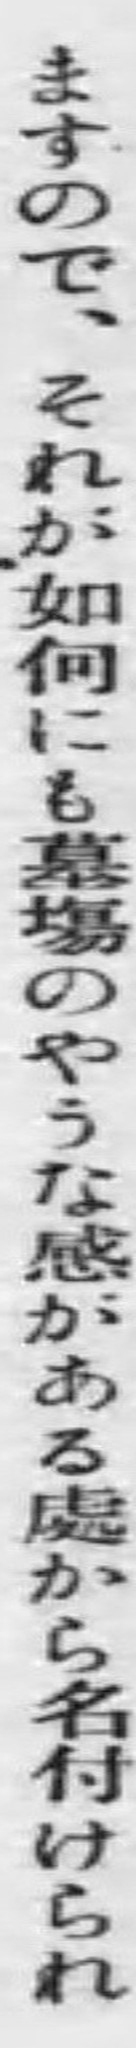ますので、それが如何にも墓場のやうな感がある処から名付けられ
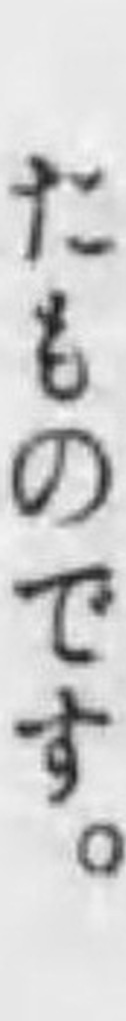たものです。
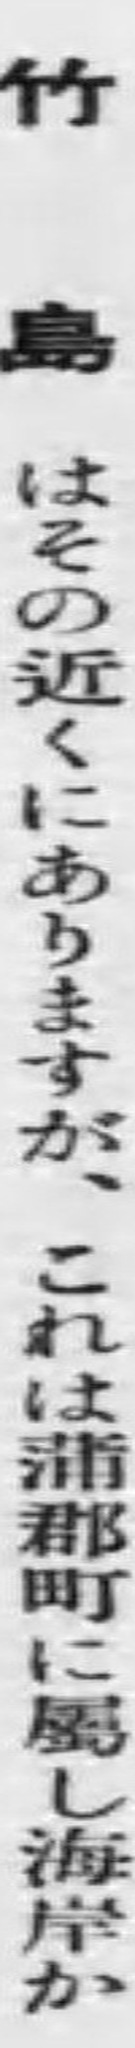竹島はその近くにありますが、これは蒲郡町に属し海岸か
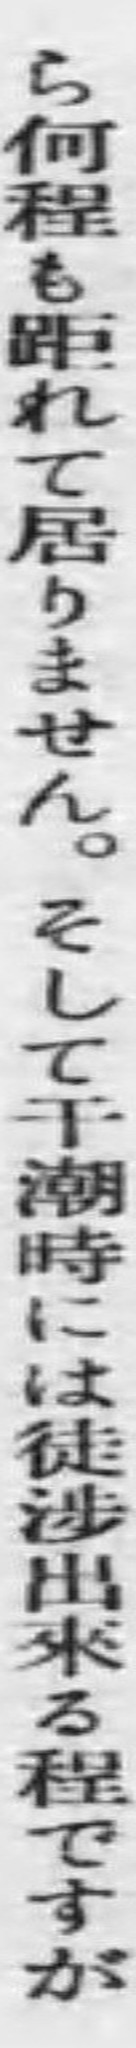ら何程も距れて居りません。そして干潮時には徒渉出来る程ですが
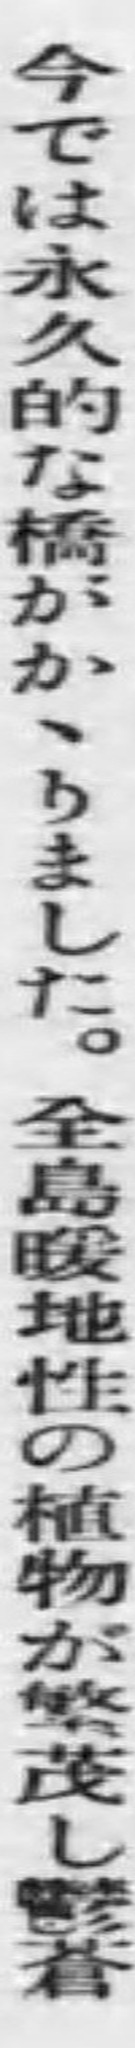今では永久的な橋がかゝりました。全島暖地性の植物が繁茂し鬱蒼
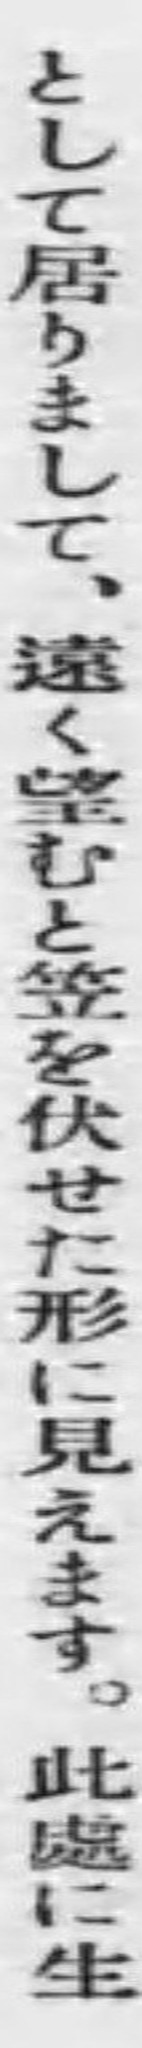として居りまして、遠く望むと笠を伏せた形に見えます。此処に生
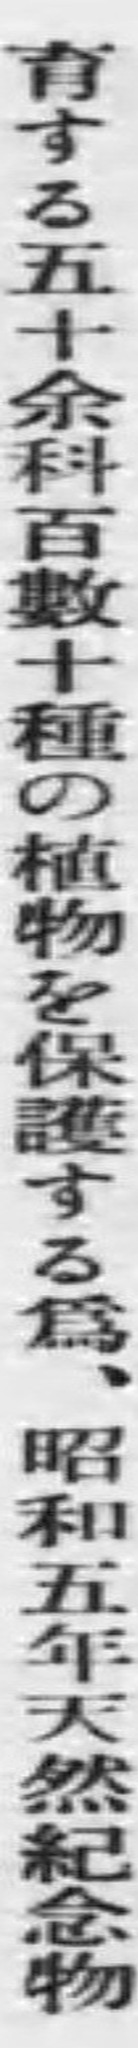育する五十余科百数十種の植物を保護する為、昭和五年天然紀念物
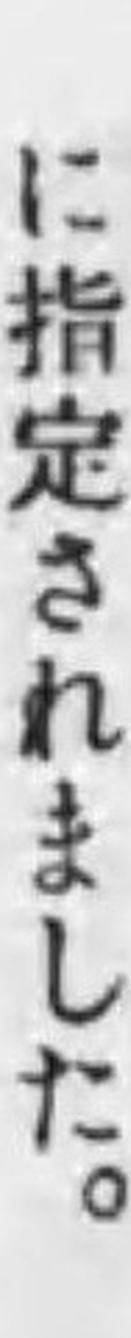に指定されました。
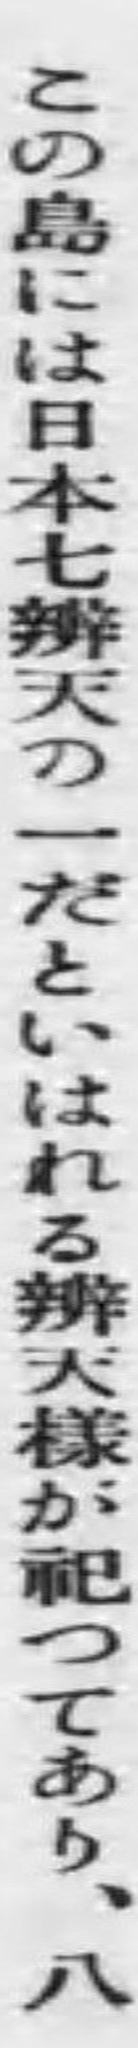この島には日本七弁天の一だといはれる弁天様が祀つてあり、八
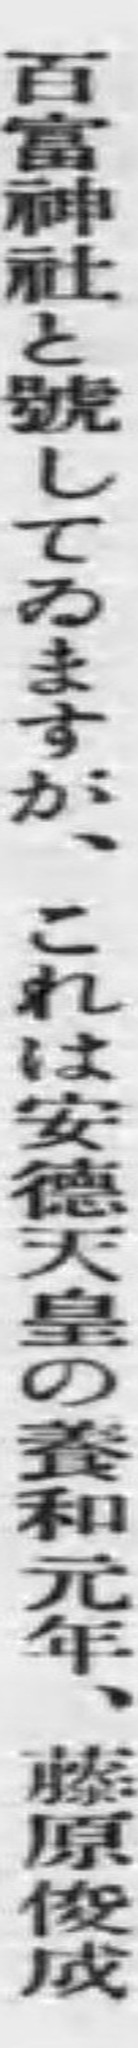百富神社と号してゐますが、これは安徳天皇の養和元年、藤原俊成
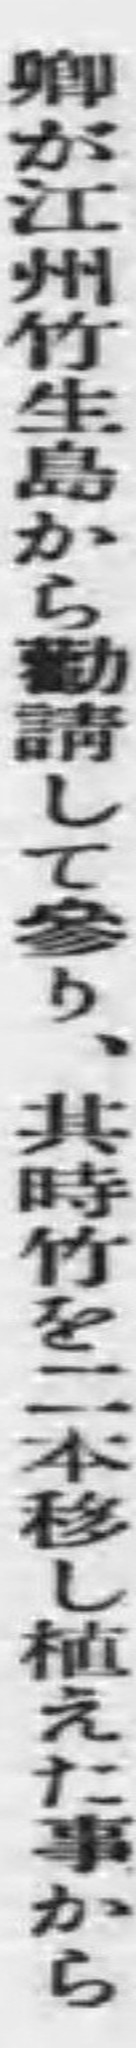卿が江州竹生島から勧請して参り、其時竹を二本移し植えた事から
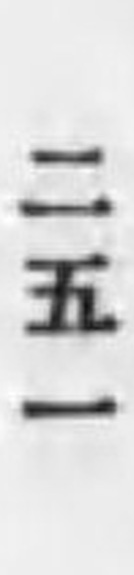二五一

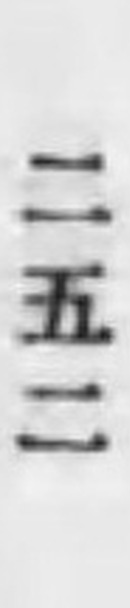二五二
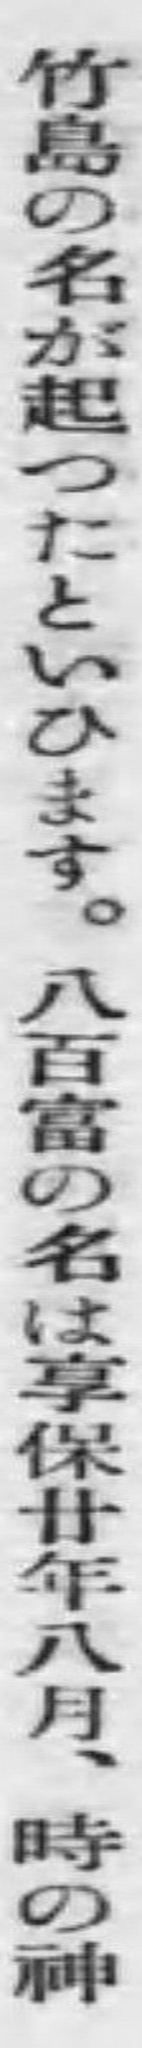竹島の名が起つたといひます。八百富の名は享保廿年八月、時の神
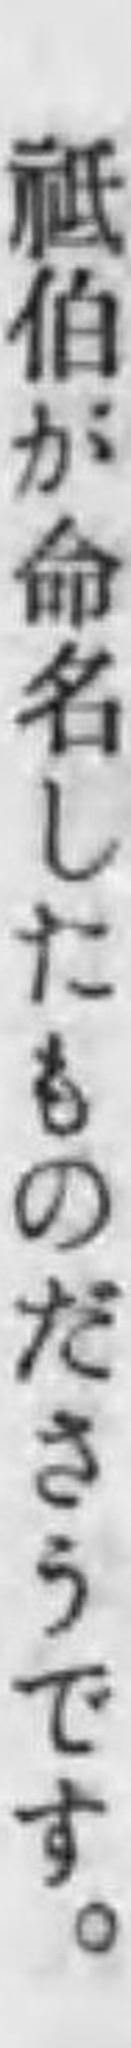祗伯が命名したものださうです。
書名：東三河道中記 : 豊橋市及其附近案内
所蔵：国立国会図書館 National Diet Library, JAPAN
